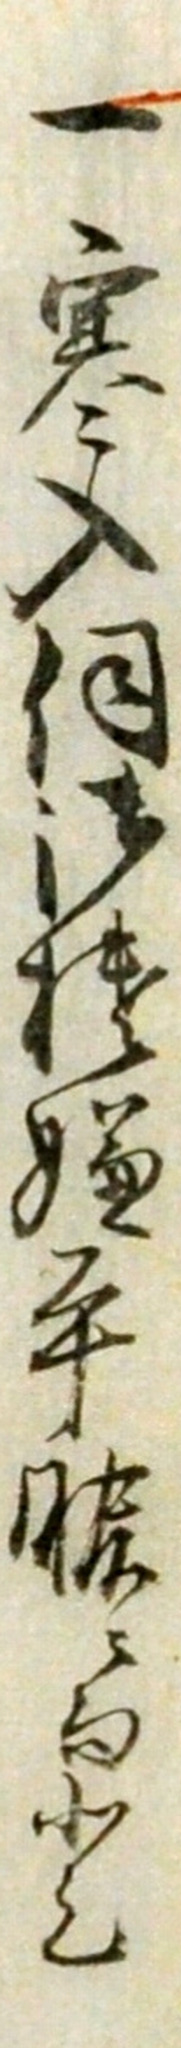一寒入伺御機嫌平服にて登
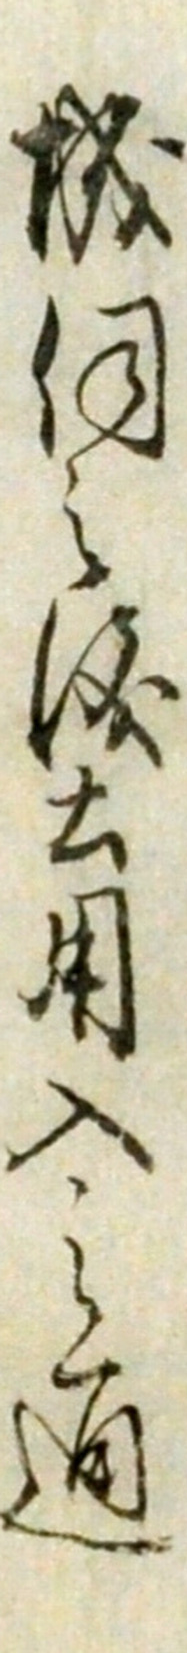城伺之儀土用入之通
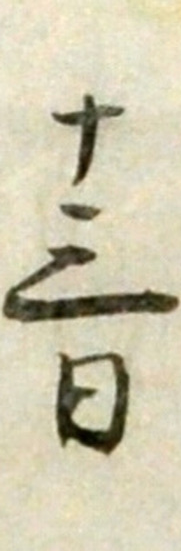十五日
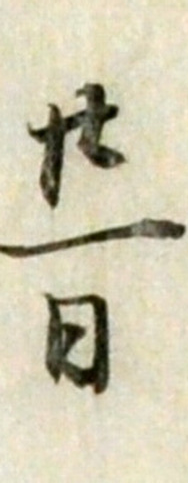廿八日

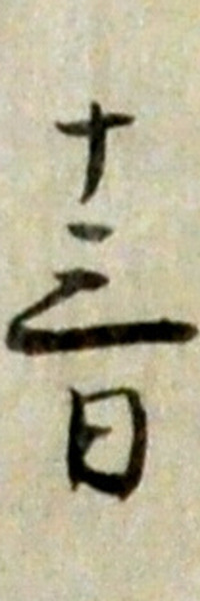十三日
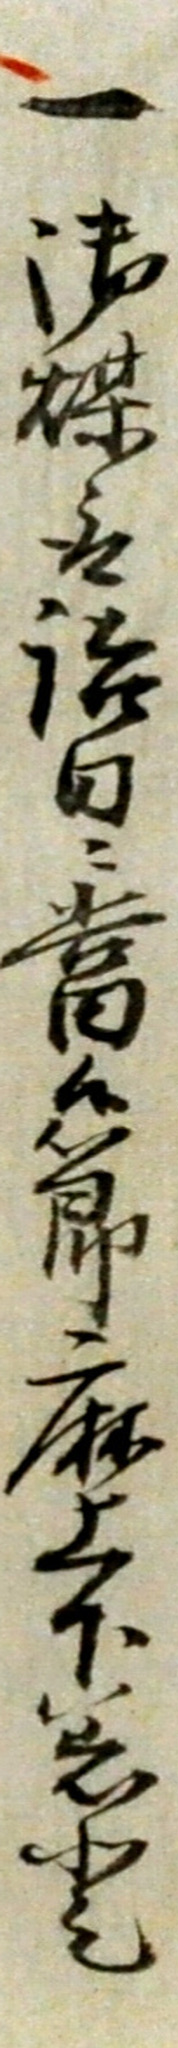一御煤取詰日に当候節麻上下着登
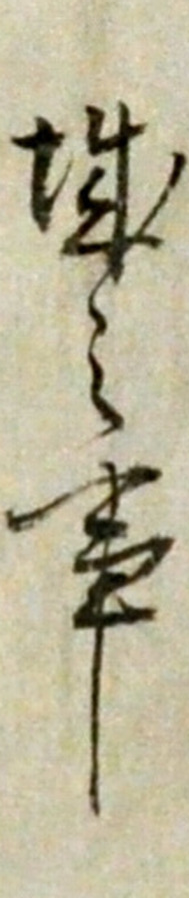城之事
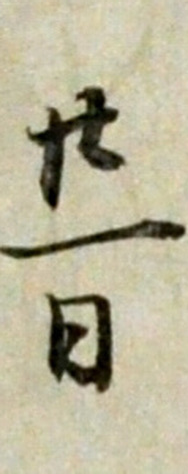廿一日
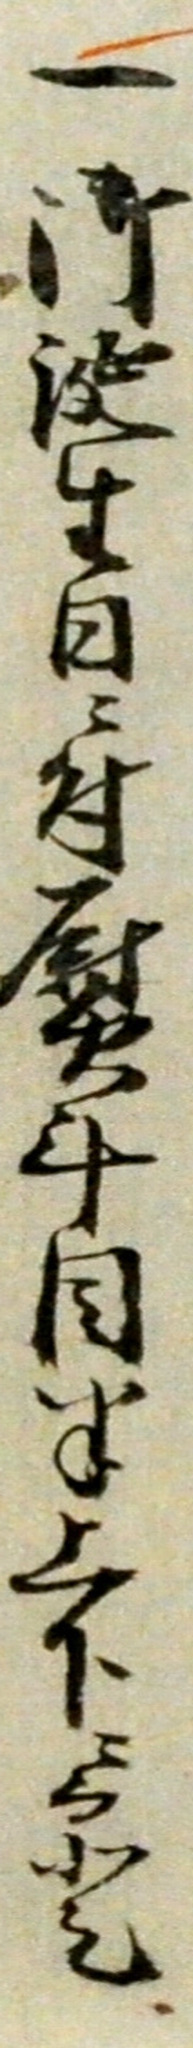一御誕生日に付熨斗目半上下にて登
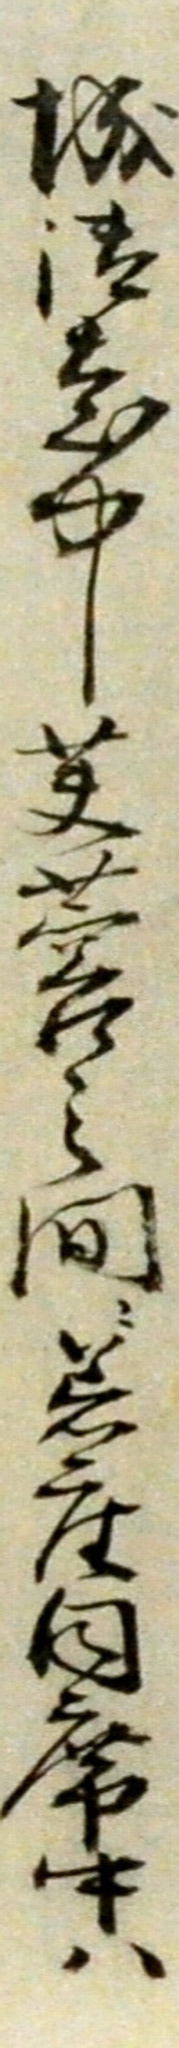城御老中芙蓉之間に着座同席中は
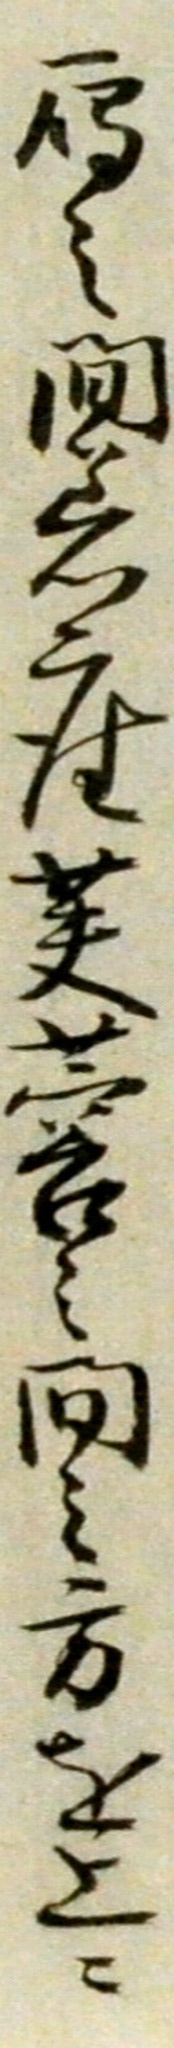雁之間着座芙蓉之間之方を上に
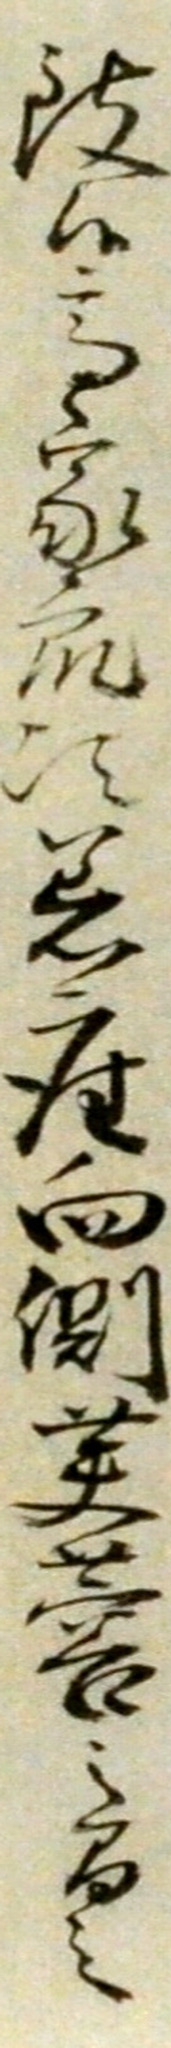致候高家衆次着座向側芙蓉之間之
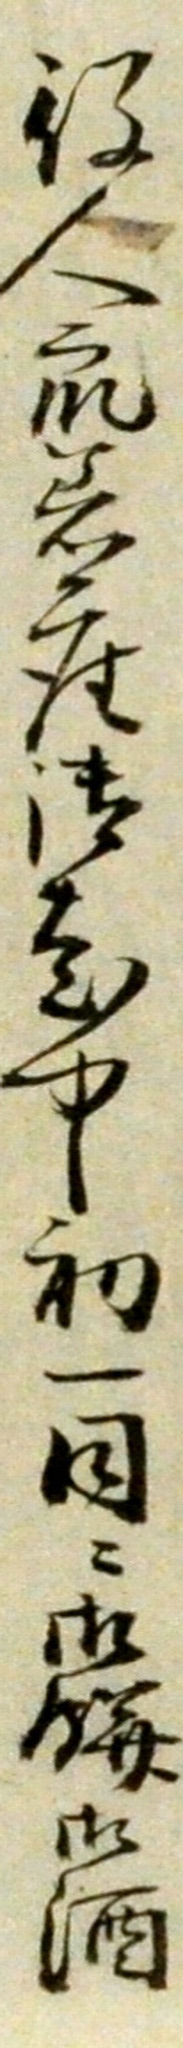役人衆着座御老中初一同に御餅御酒
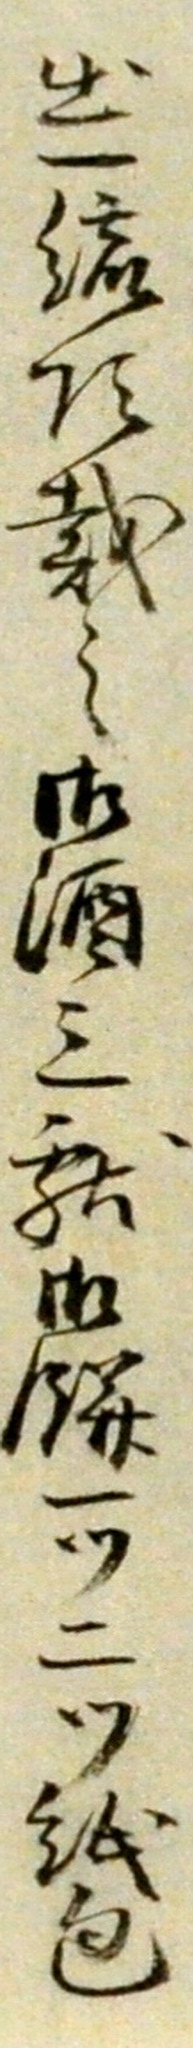出一統頂戴之御酒三献御餅一ツ二ツ紙包
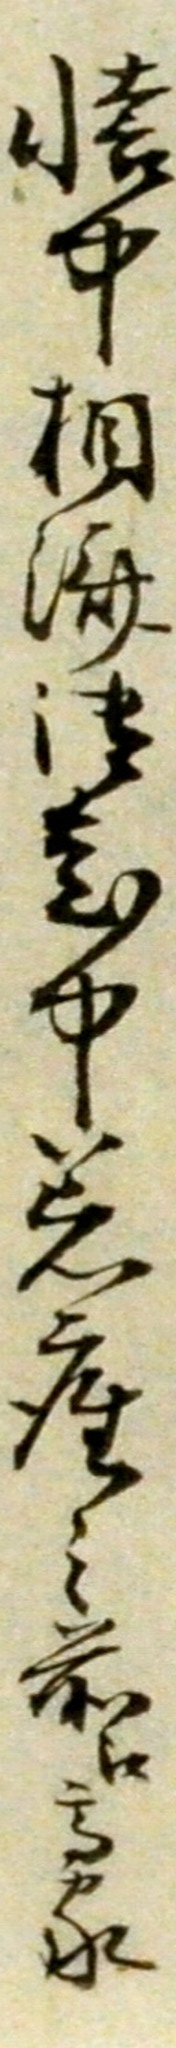懐中相済御老中着座之前え高家
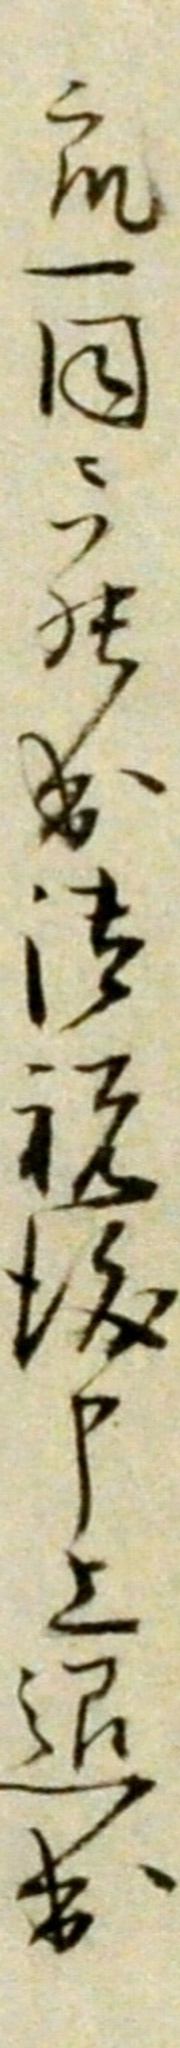衆一同に罷出御祝儀申上退出
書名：申合帳〔一括〕
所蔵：伊那市立高遠町図書館・合同会社AMANE
